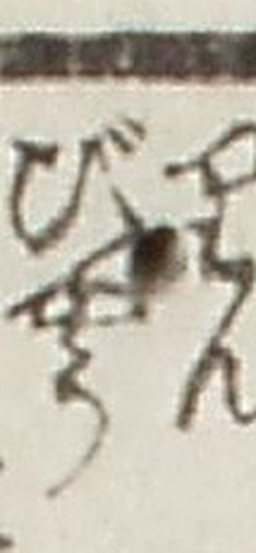びやう
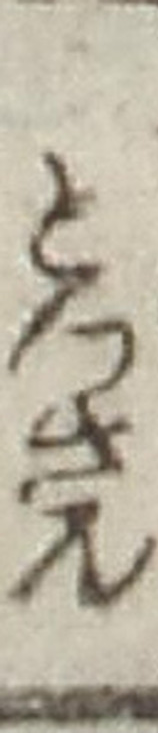とつさん
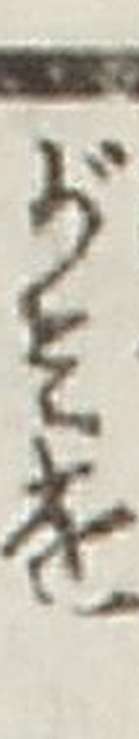がみを
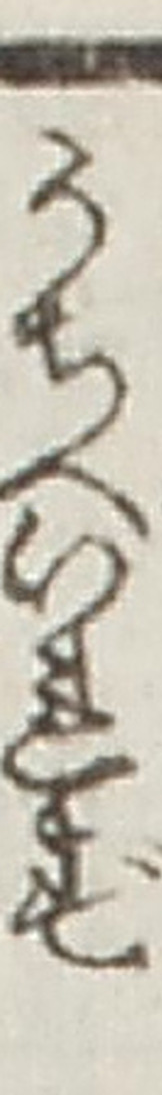うちへいれず
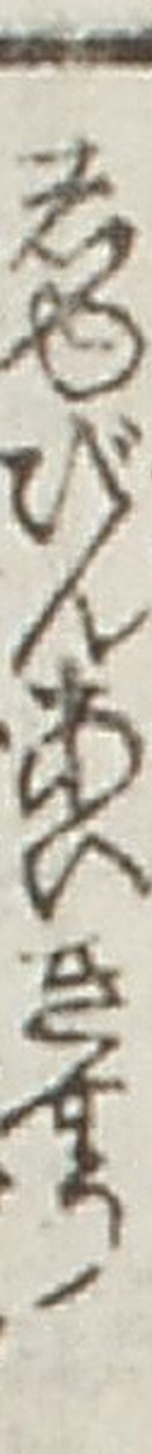しゆびんあいきやう
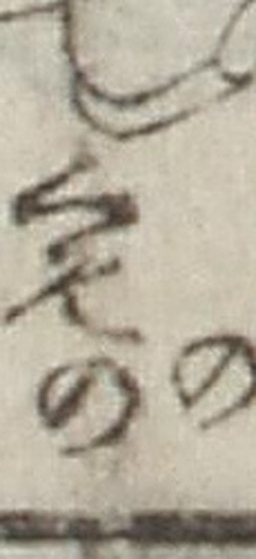くその
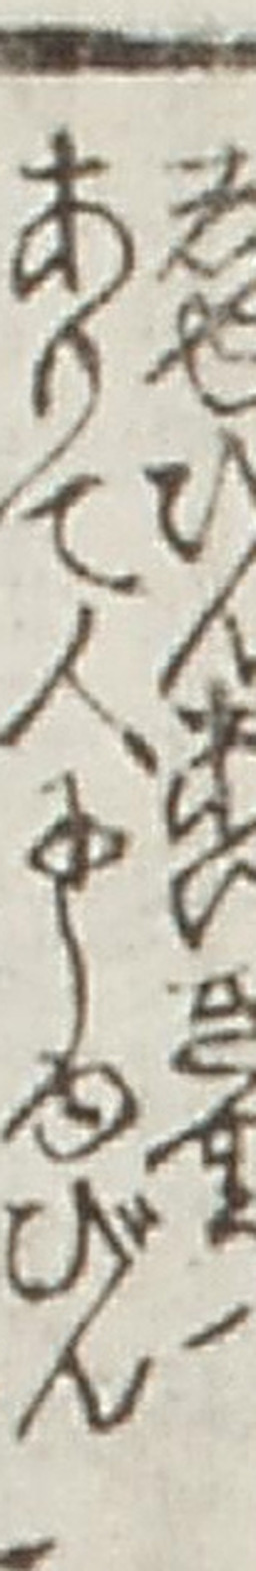ありて人にしゆびん
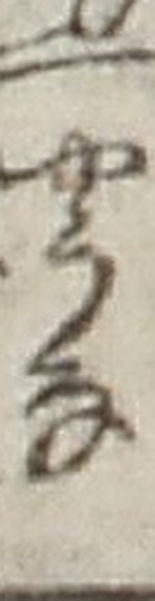やうな
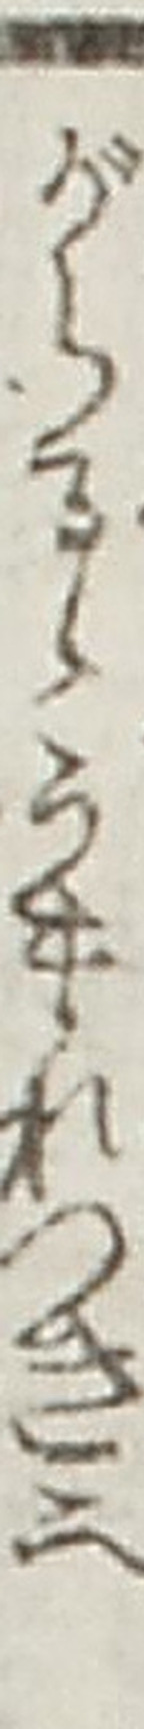がらるゝうまれつき也
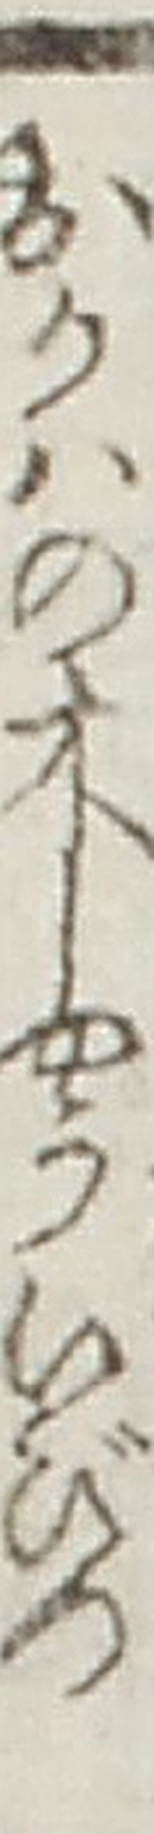おかはの木しやういびつ
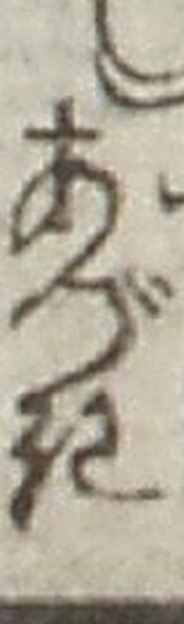あづき
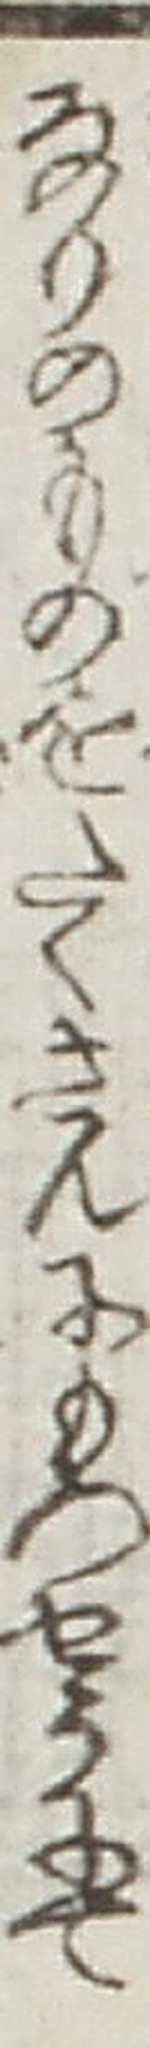なりのものをたくさんにもつせうにて
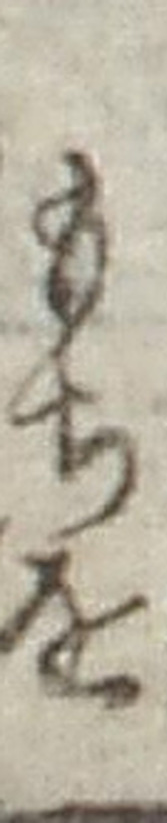もちを
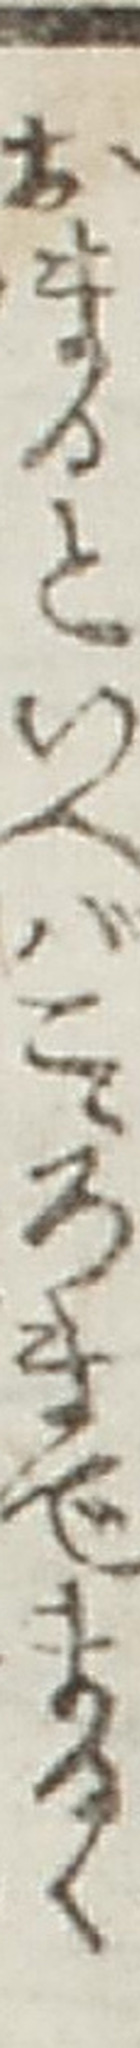おまるといへばこゝろまでまるく
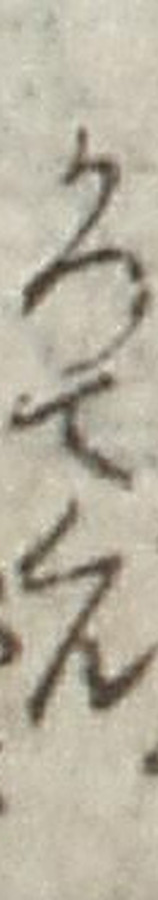かつてくん
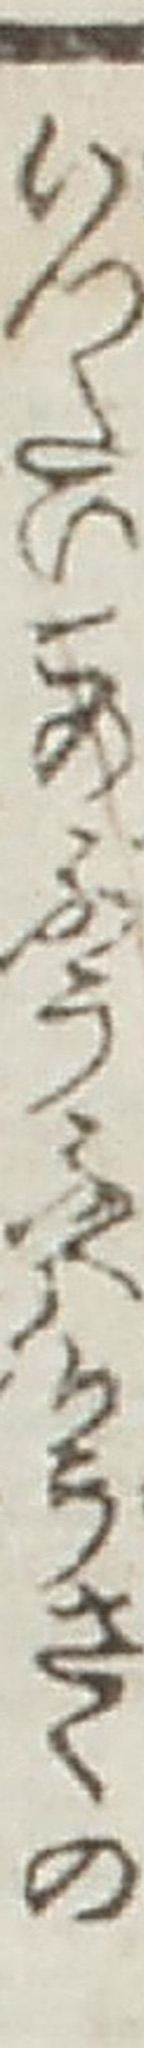いつたいこのふうふは？か？うさくの
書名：三世相出雲當座帳　上下冊
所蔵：東京大学地震研究所図書室 Earthquake Research Institute Library, The University of Tokyo, JAPAN
